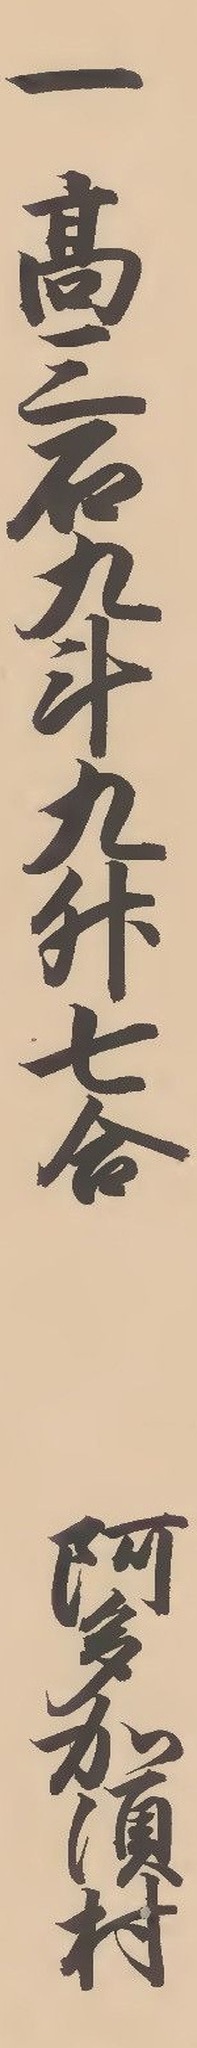一高三石九斗九升七合阿多加須村
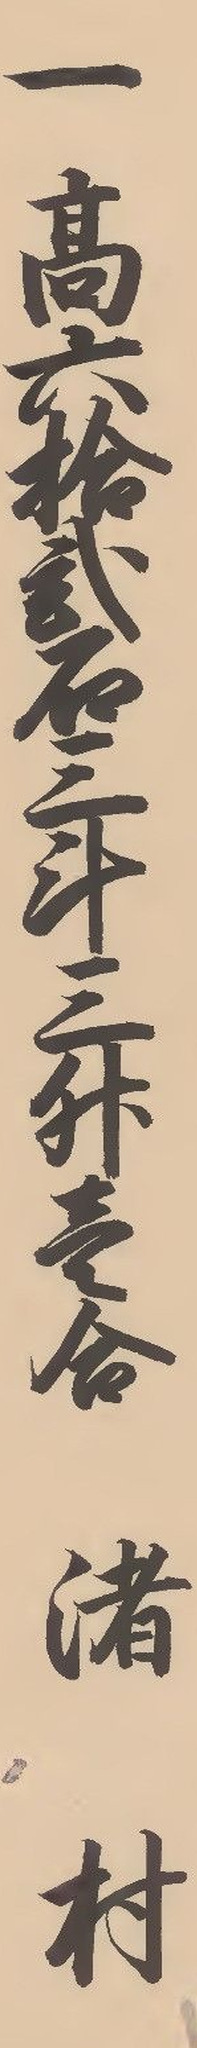一高六拾弐石三斗三升壱合渚村

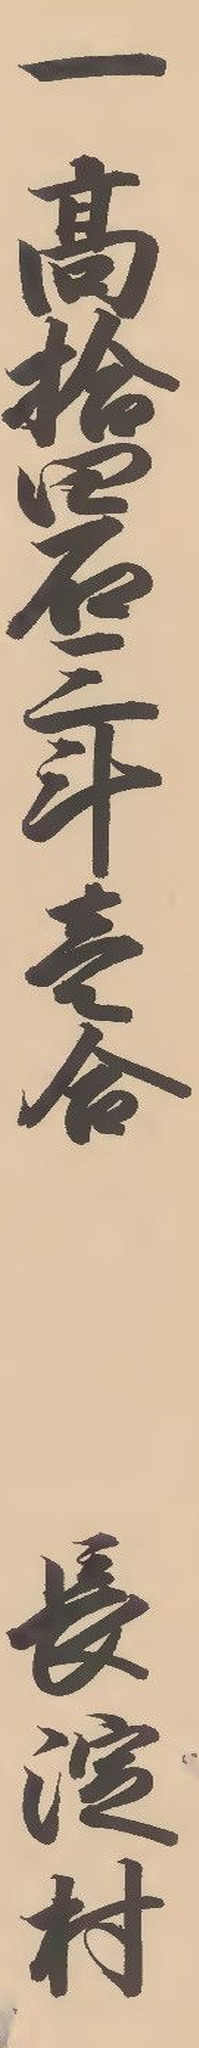一高拾四石三斗壱合長淀村
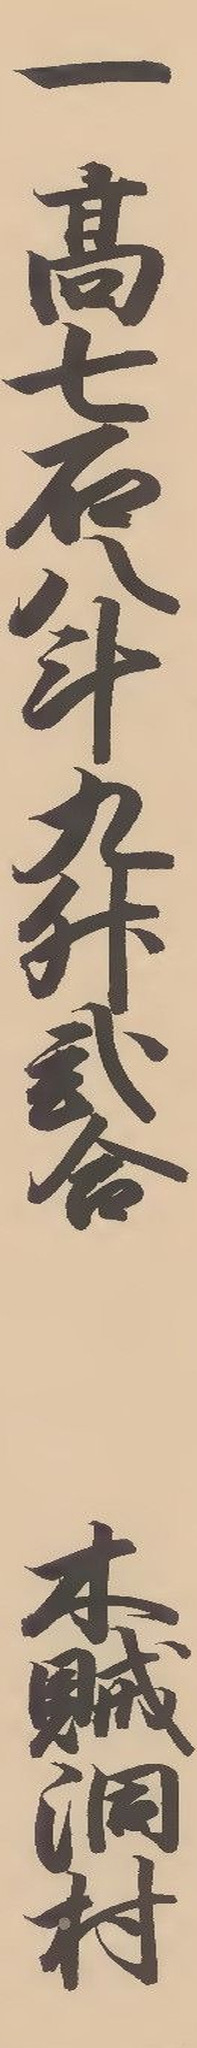一高七石八斗九升弐合木賊洞村
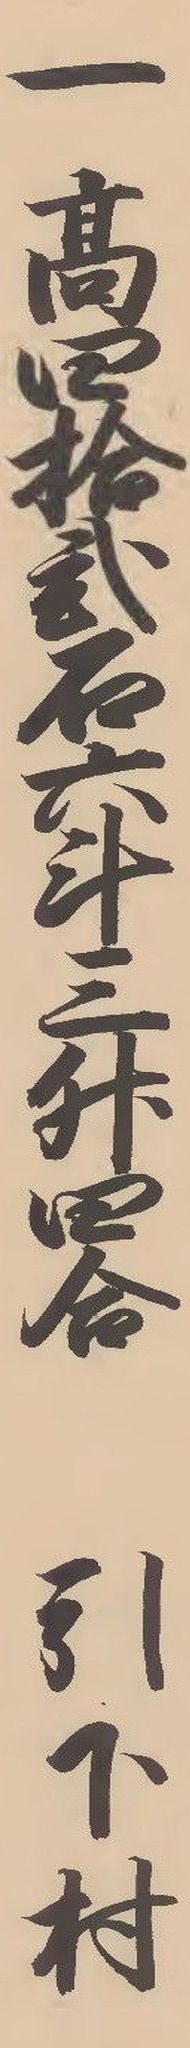一高四拾弐石六斗三升四合引下村
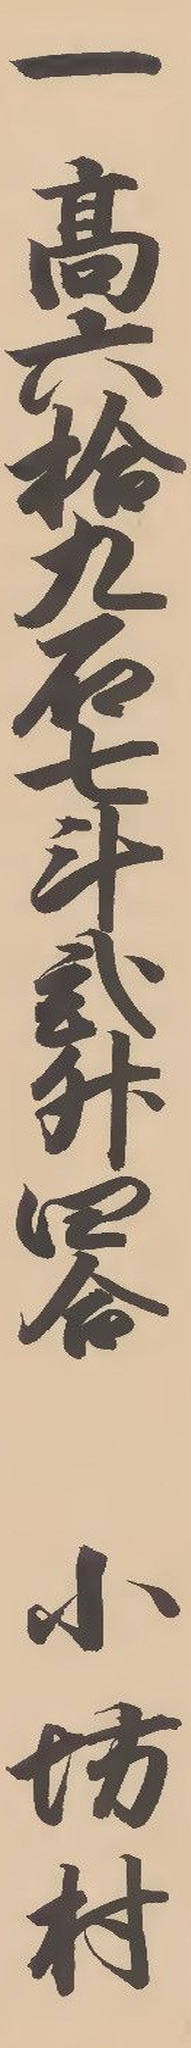一高六拾九石七斗弐升四合小坊村
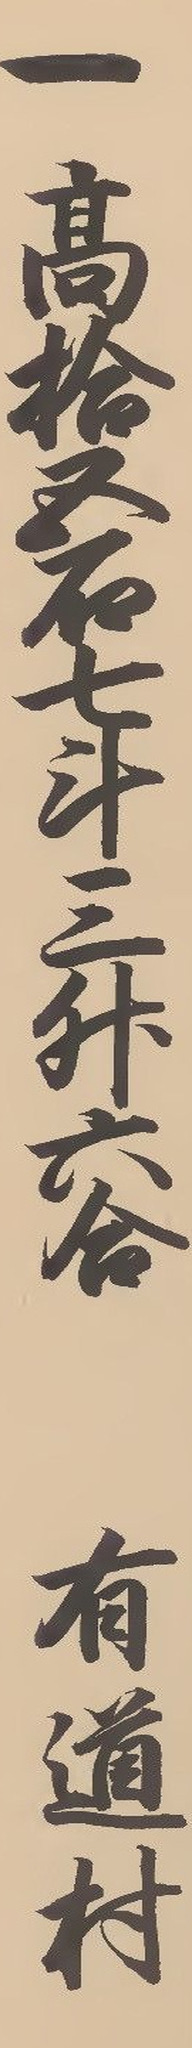一高拾五石七斗三升六合有道村
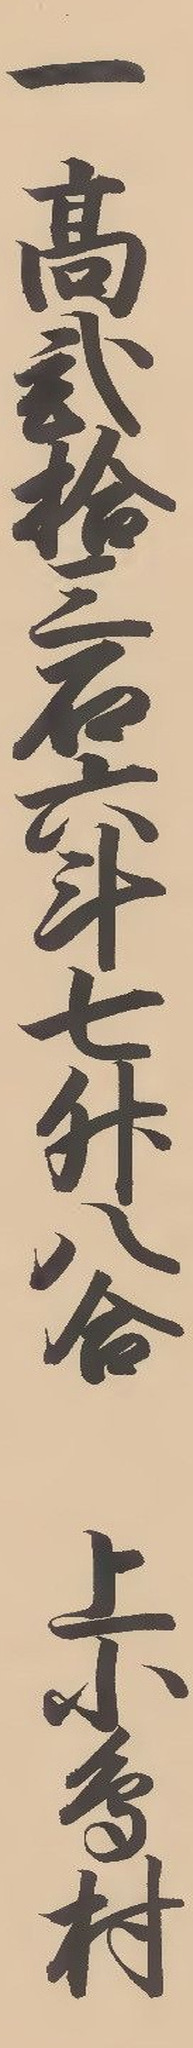一高弐拾三石六斗七升八合上小鳥村
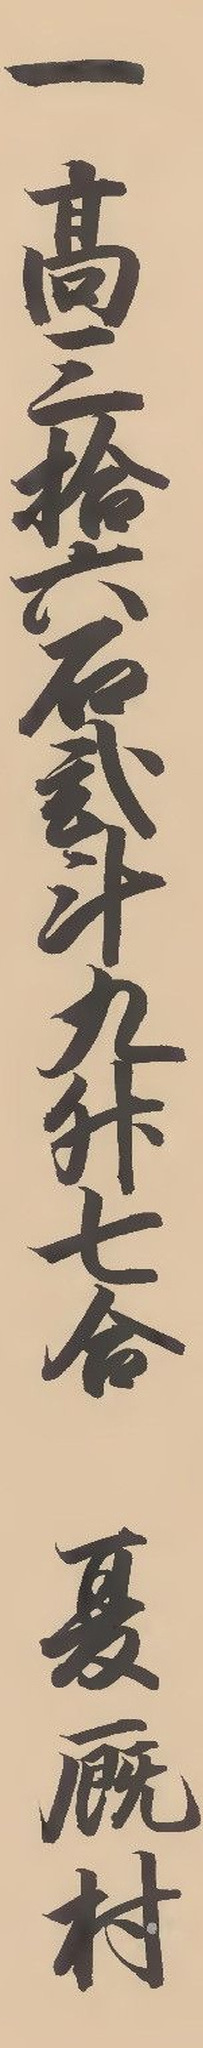一高三拾六石弐斗九升七合夏厩村
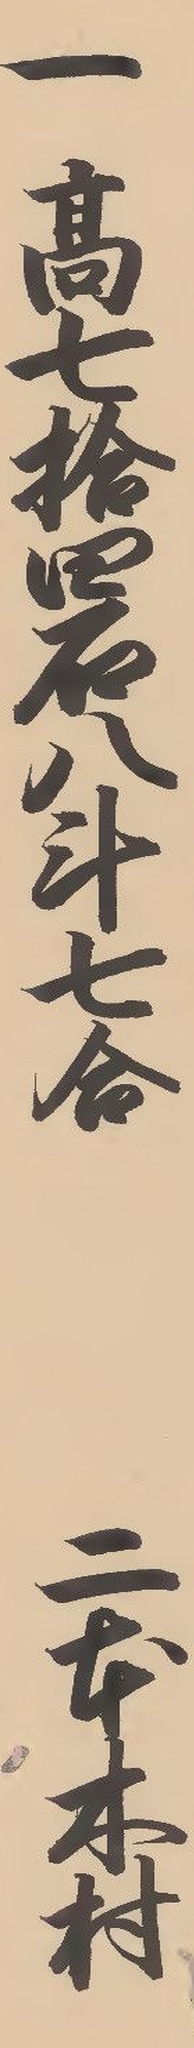一高七拾四石八斗七合二本木村

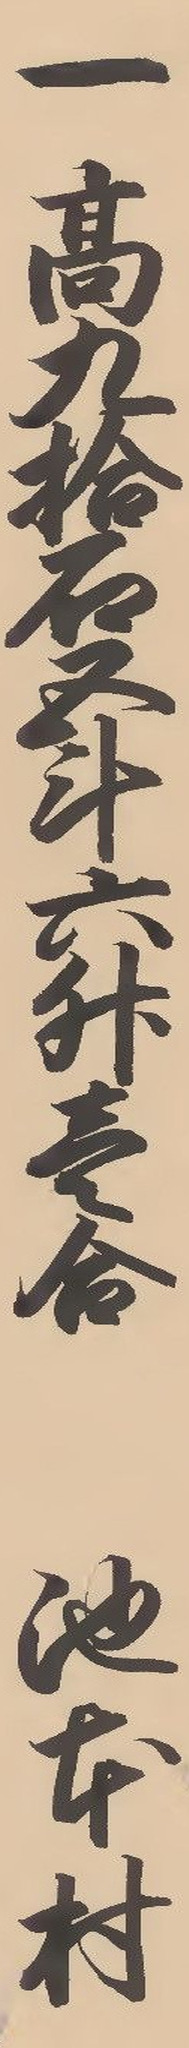一高九拾石五斗六升壱合池本村
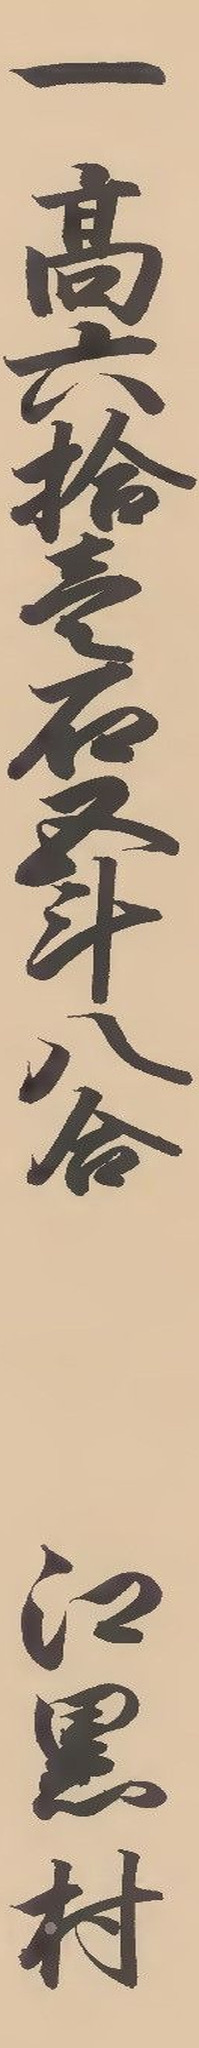一高六拾壱石五斗八合江黒村
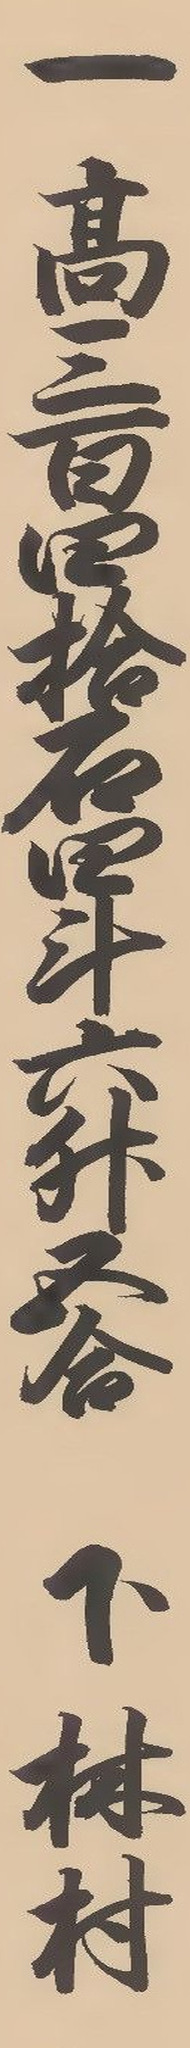一高三百四拾石四斗六升五合下林村
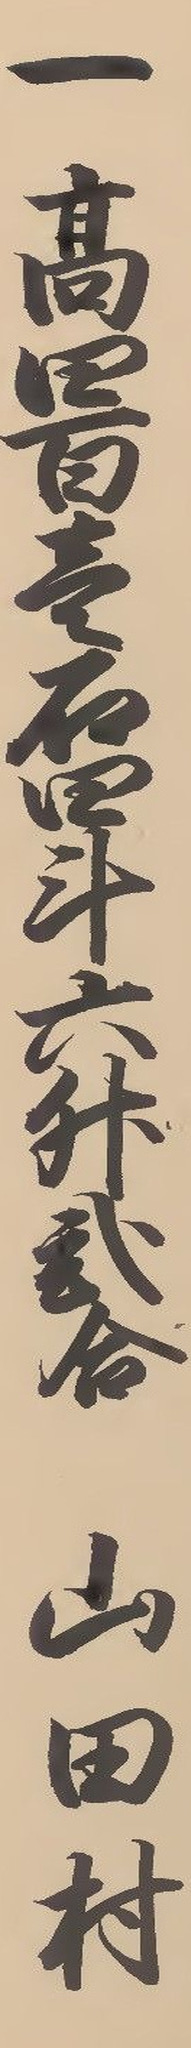一高四百壱石四斗六升弐合山田村
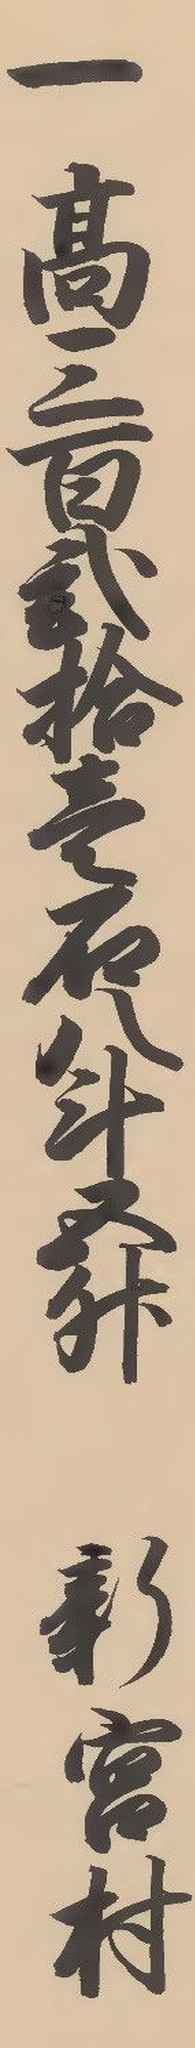一高三百弐拾壱石八斗五升新宮村
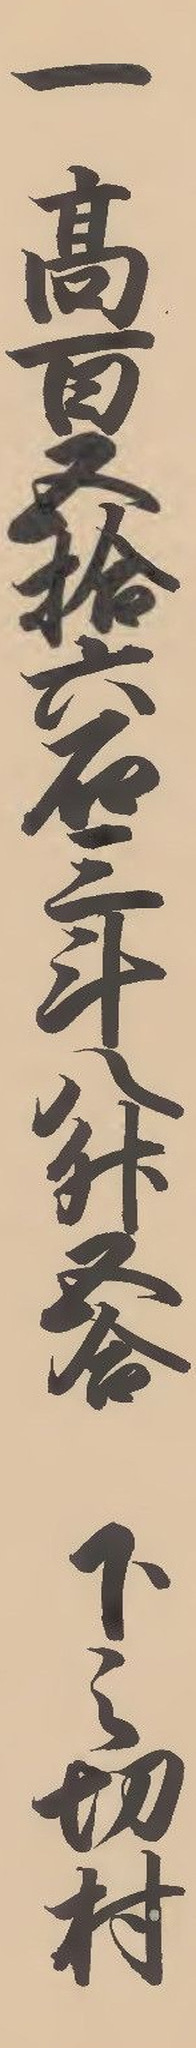一高百五拾六石三斗八升五合下之切村
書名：飛騨国郷帳
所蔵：国立公文書館 National Archives of Japan
